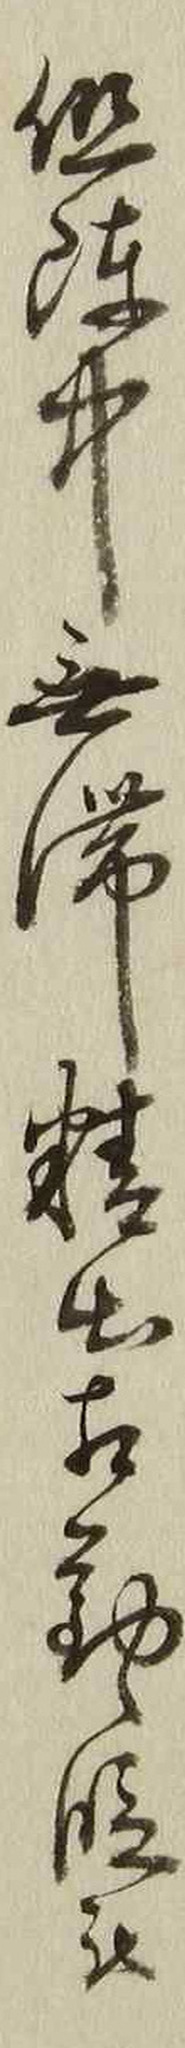但陣中無滞精出相勤候段被
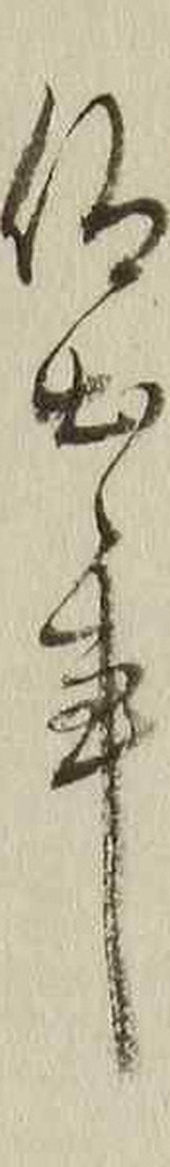仰出候事
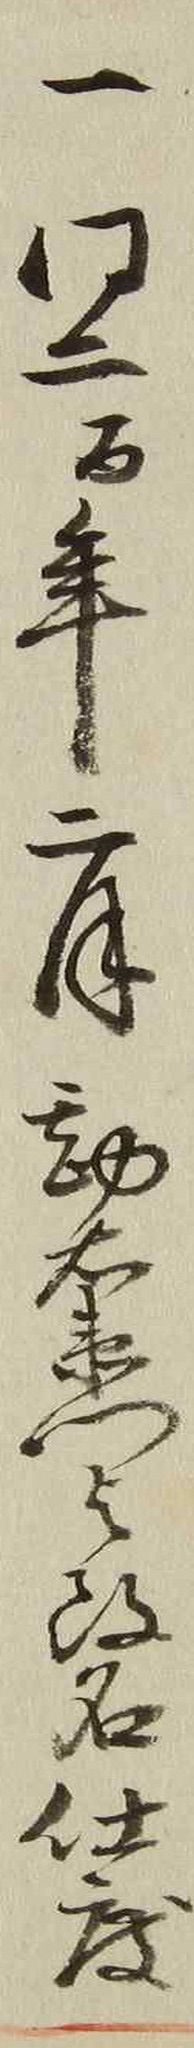一同二酉年二月勘右衛門与改名仕度
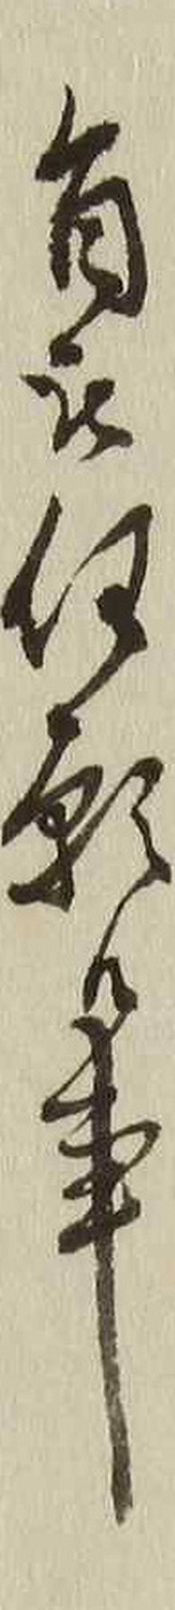旨被任願候事
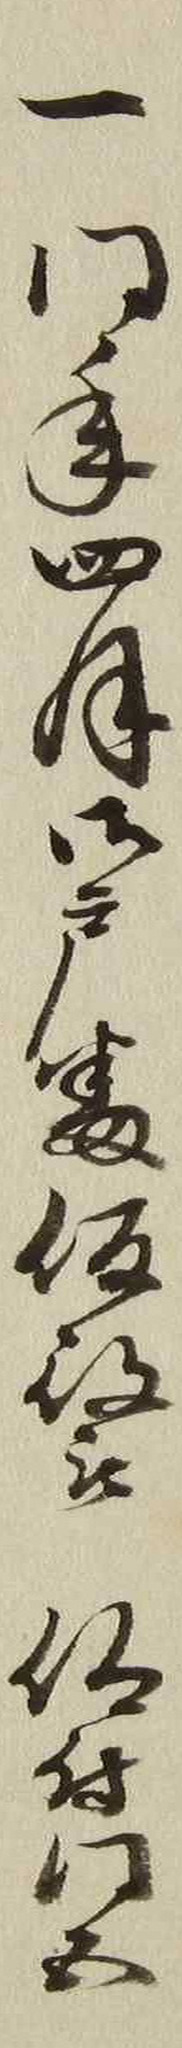一同年四月御戸番仮役被仰付同五
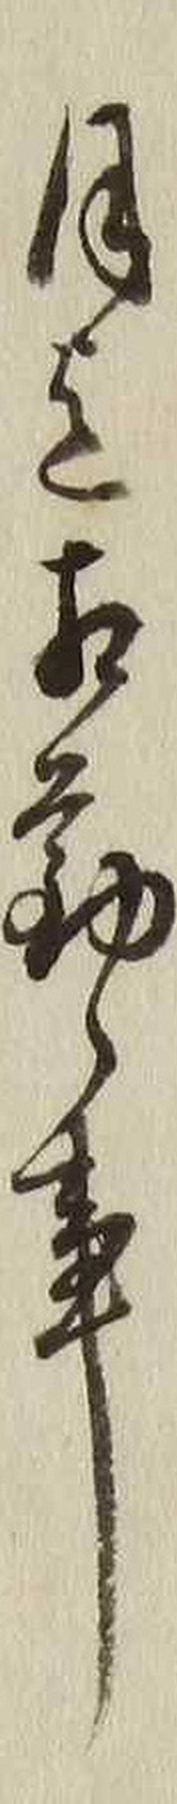月迄相勤候事
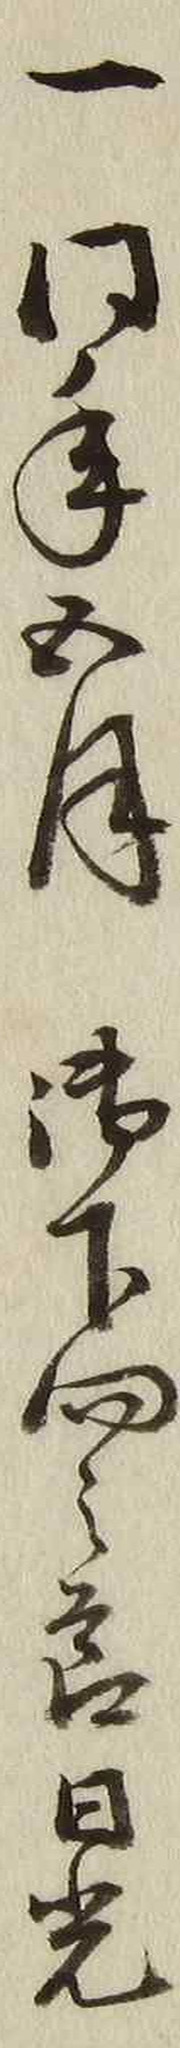一同年五月御下向之節日光
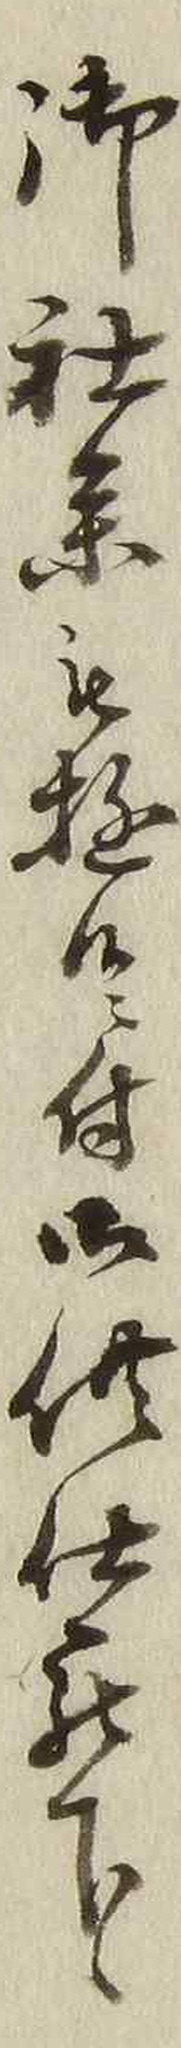御社参被遊候ニ付御供仕罷下候
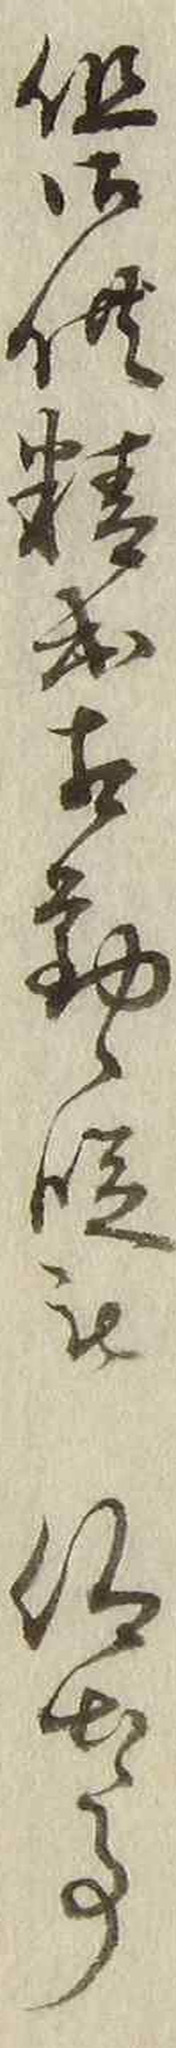但御供精出相勤候段被仰出候事
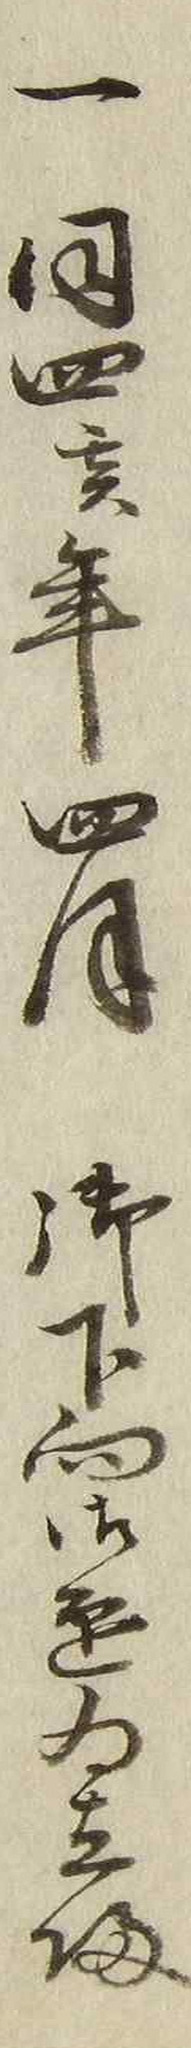一同四亥年四月御下向御迎為立帰
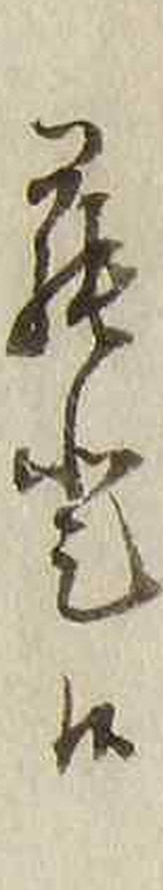罷登候
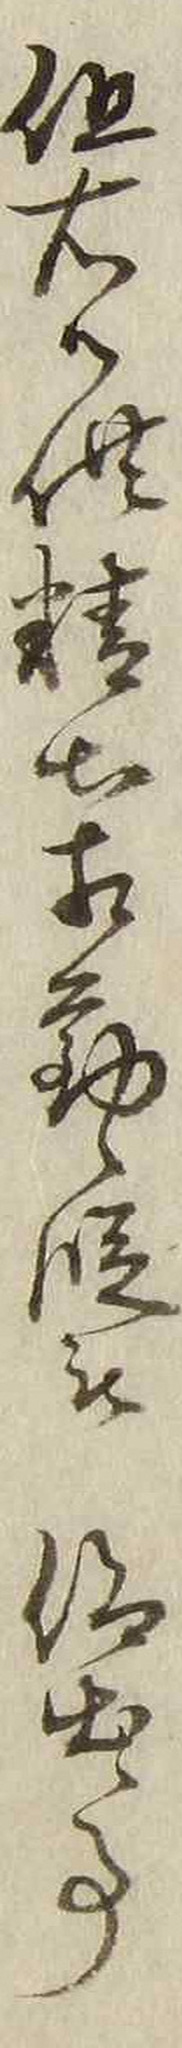但右御供精出相勤候段被仰出候事
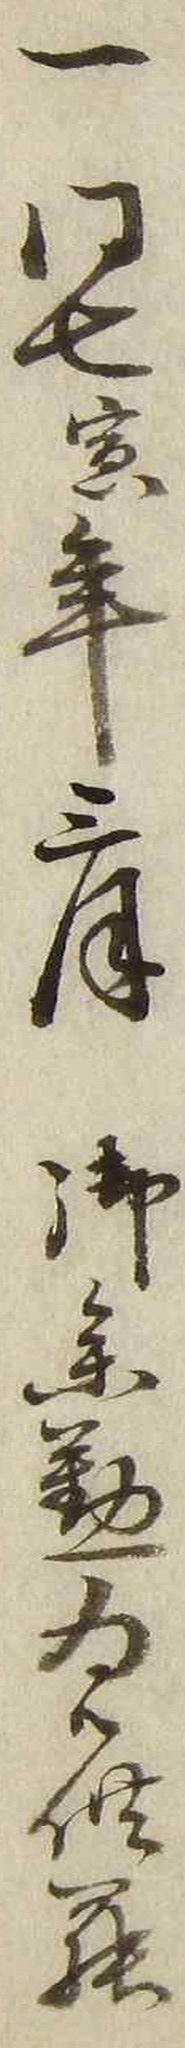一同七寅年三月御参勤為御供罷

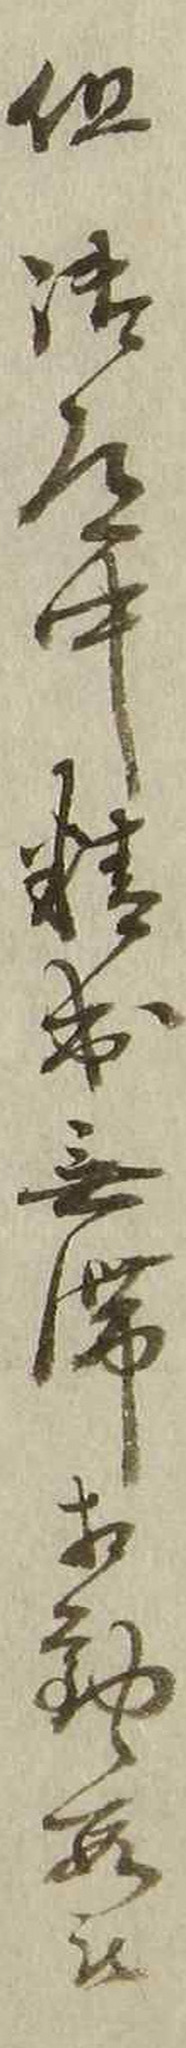但御道中精出無滞相勤候段被
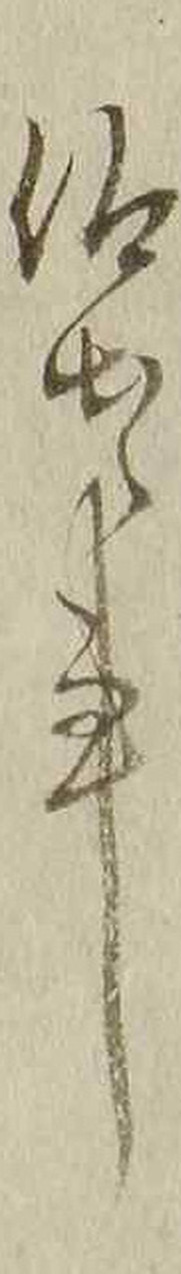仰出候事
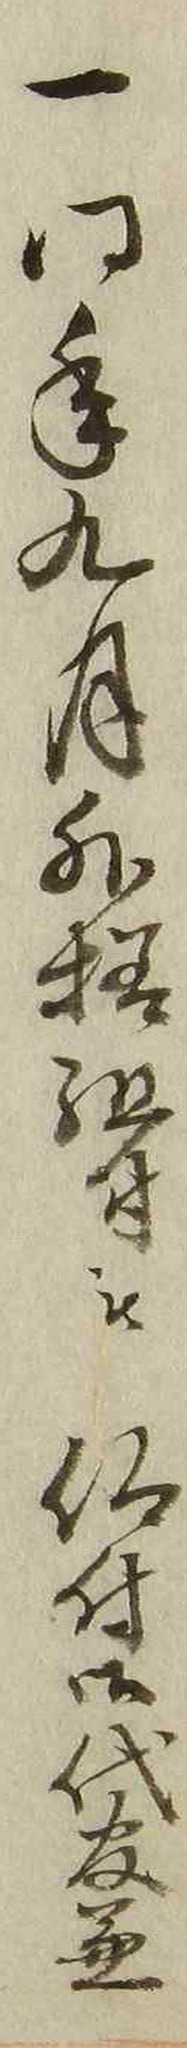一同年九月外様組付被仰付御代官兼
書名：諸士系譜　巻之27　い之部27
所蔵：会津若松市立会津図書館
